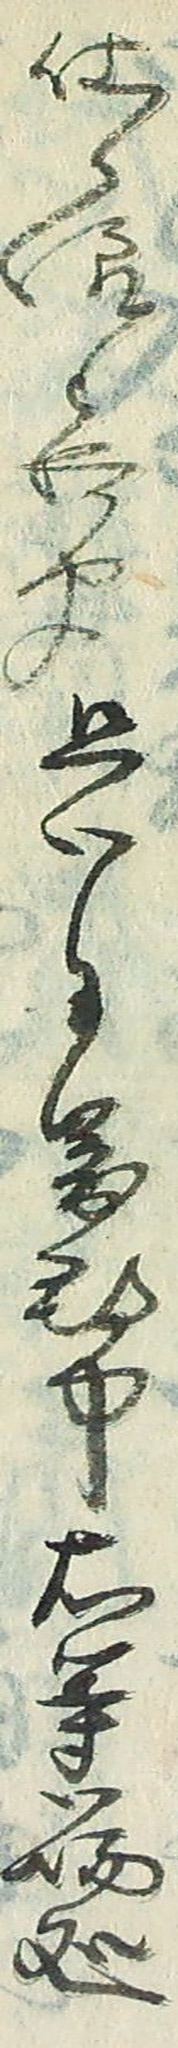仕候様被仰聞且御手嵜郡中右等御場処
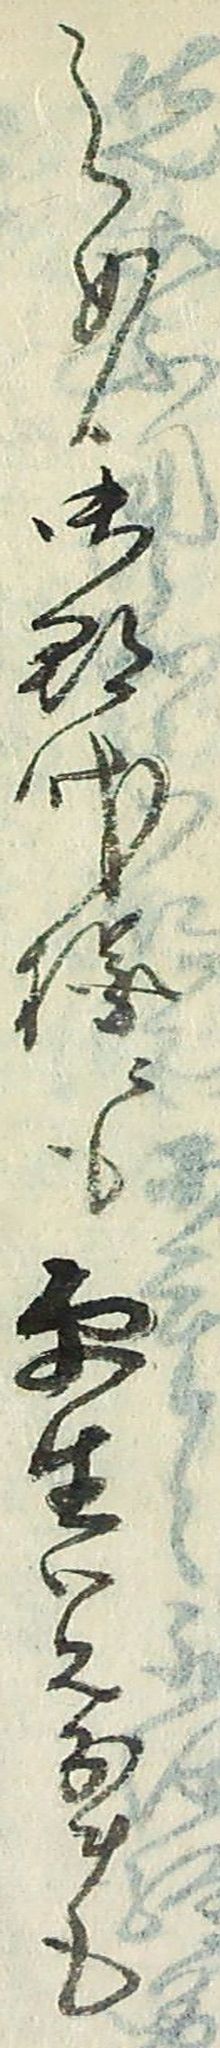之義は御郡代様にも平生御見分をも
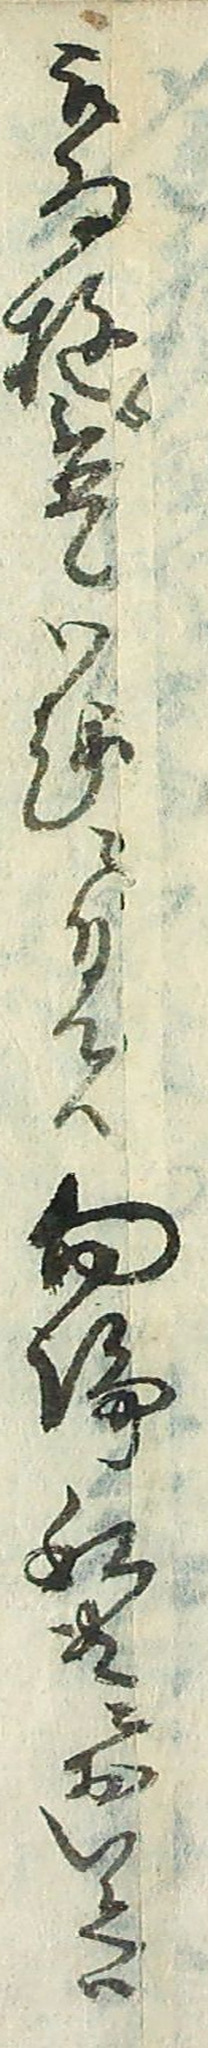被為遊置候御趣に付ては勿論私共においては
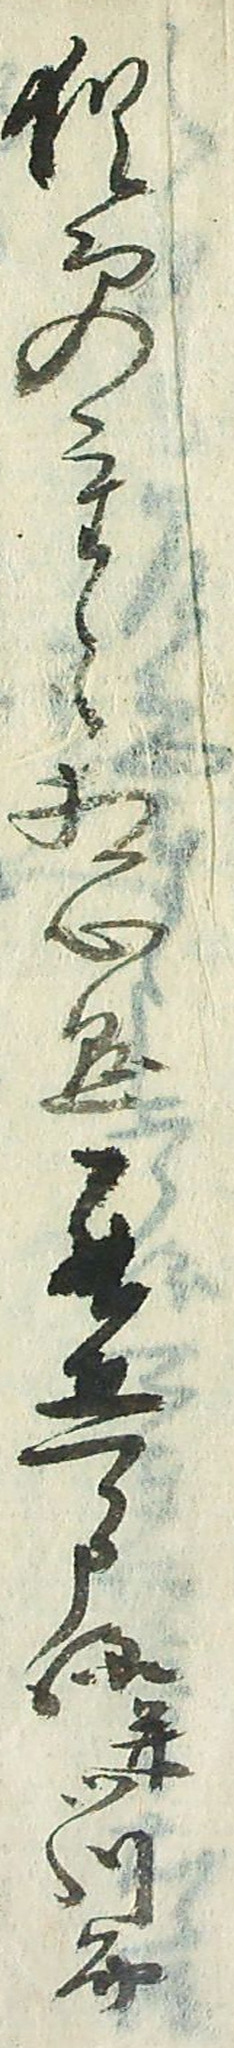猶更重々相心懸罷在可申様幷御川筋
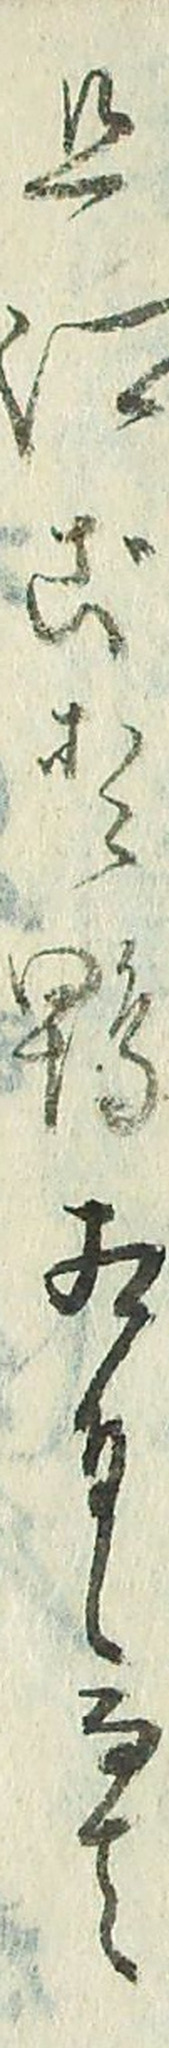且えご等に鴨相付候而は
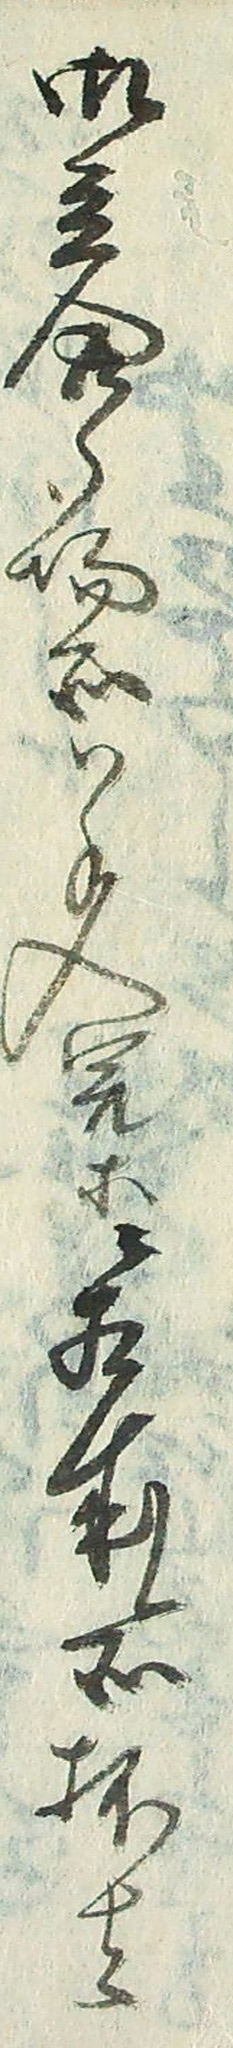御立合御場所御手入幷等に相成り候所抔は
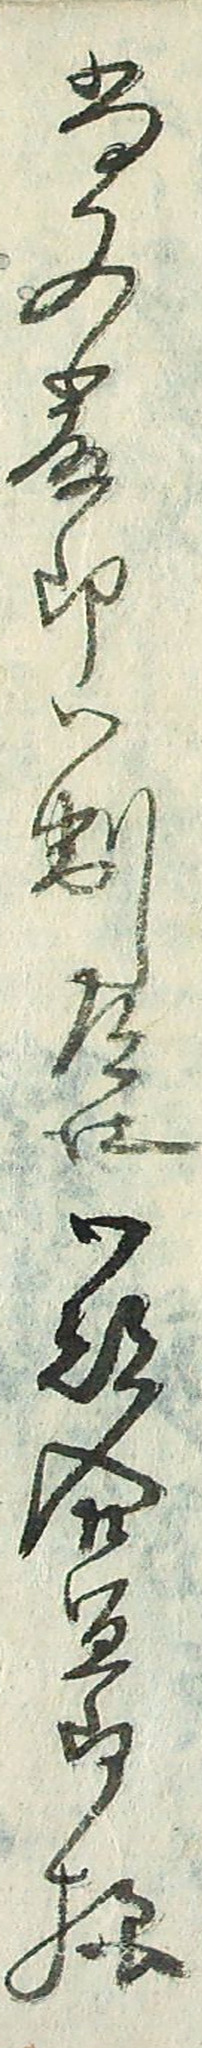尚又厳布御制道仕御都合宜布候様
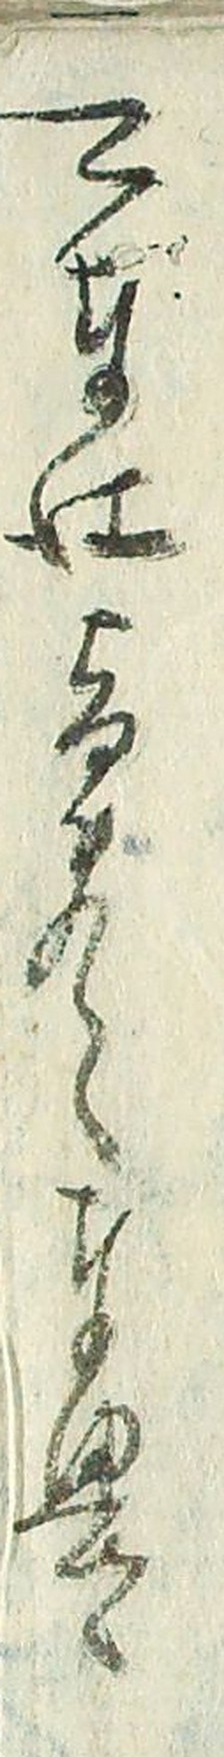可奉仕旨夫々奉畏候

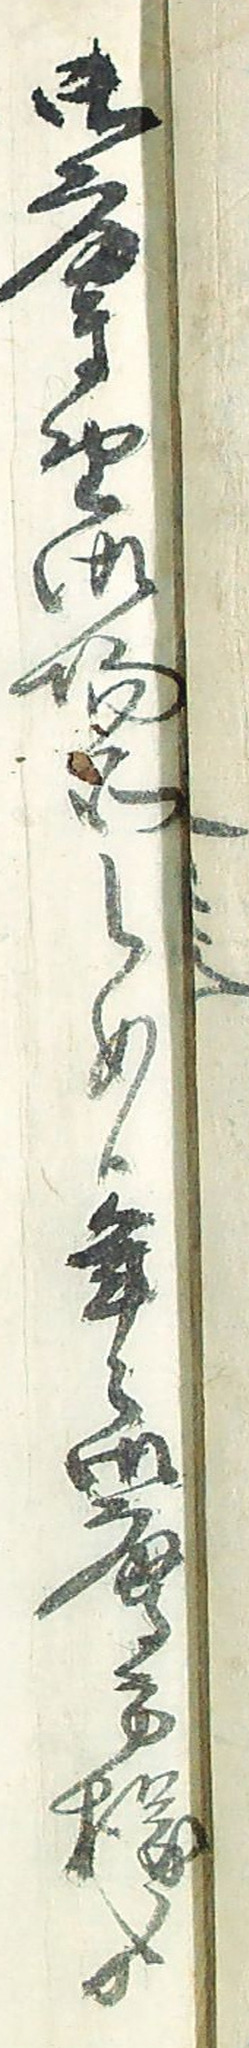御鷹野御場所之義は年々御鷹方様ゟ
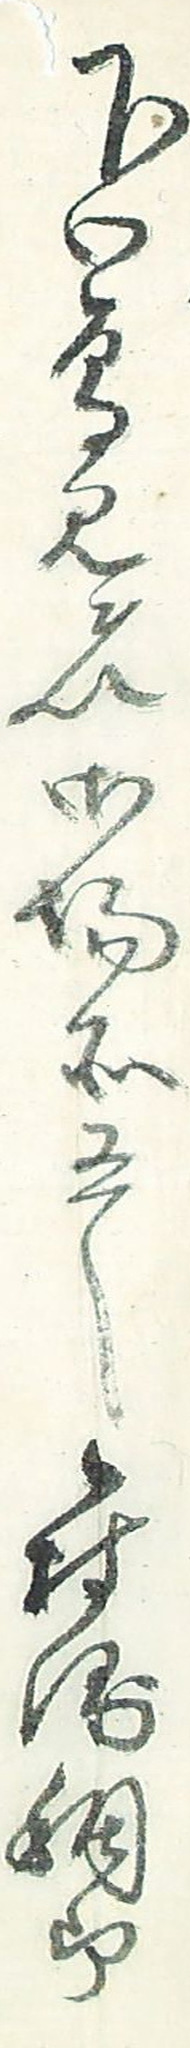下御鳥見を以御場所有之候村浦稠布
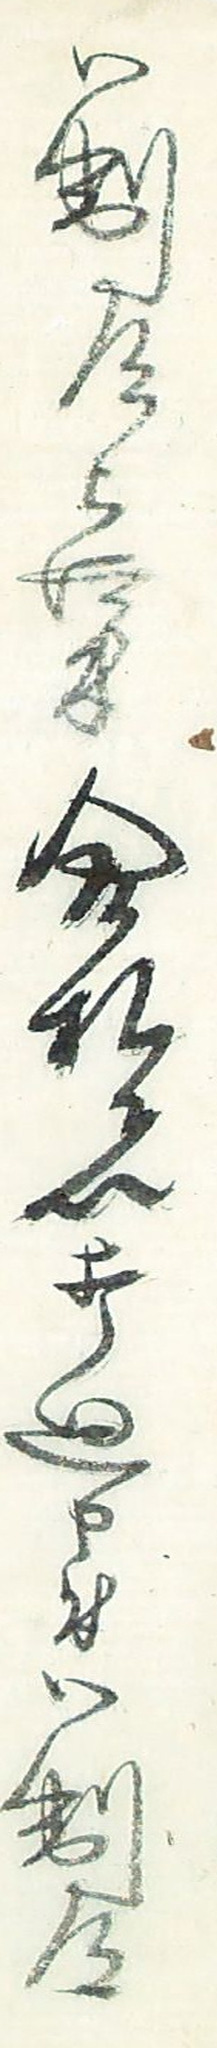御制道被仰付合札を以打廻申付御制道
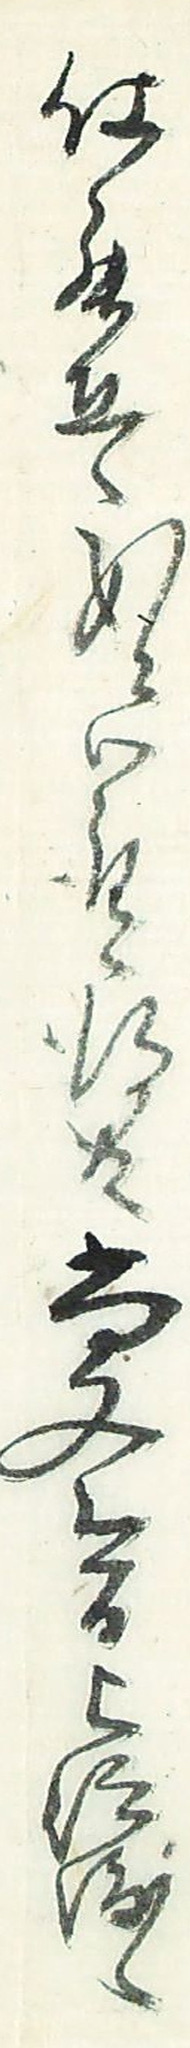仕罷在候義に御座候得共尚又今日被仰渡候
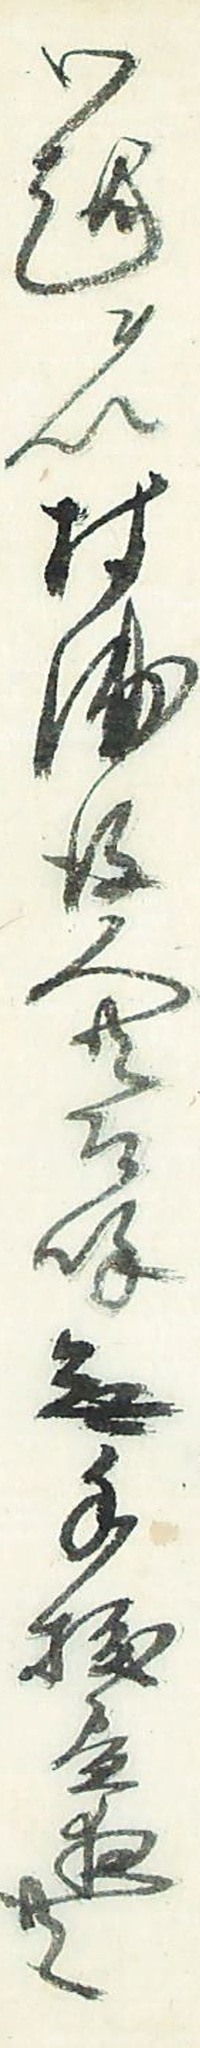御趣を以村浦役人共召呼無手抜昼夜共
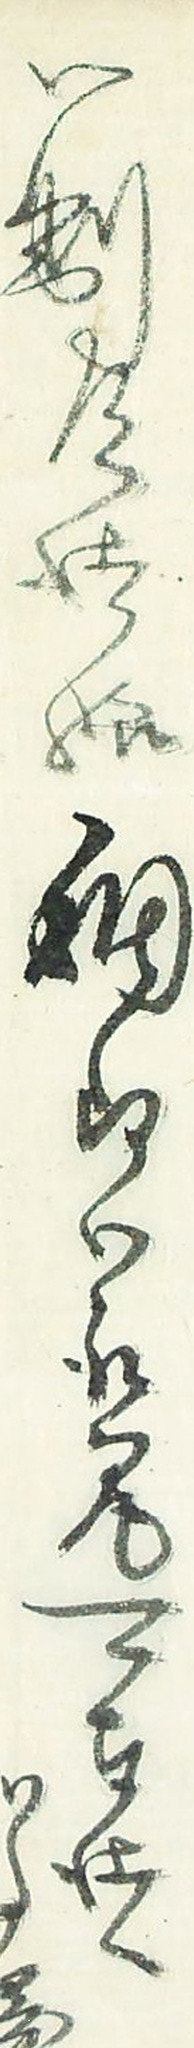御制道仕候様稠布御取究可奉仕候御手寄分
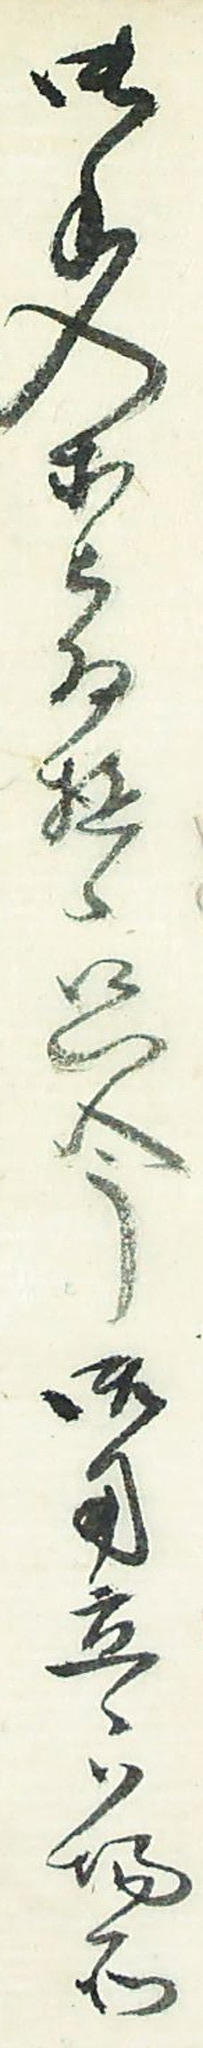御手入等被為遊候只今御用立候御場所
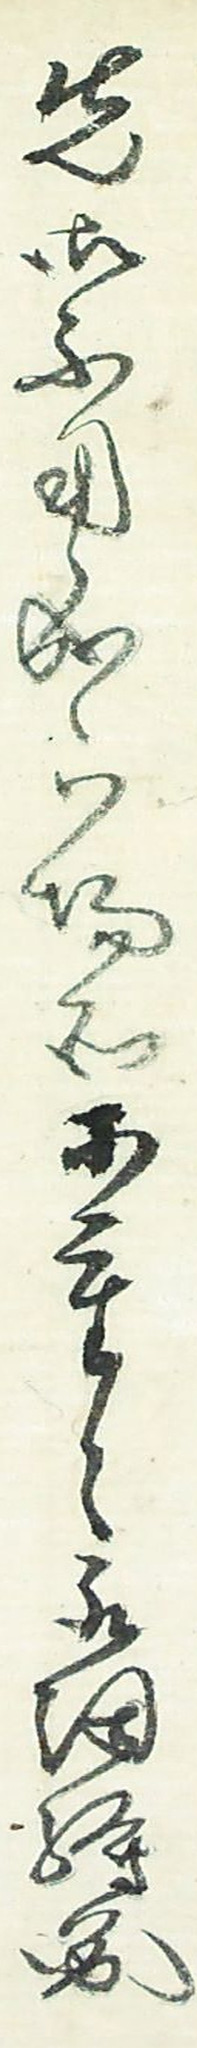先御不用被成候御場所等重々取調絵図
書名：諸御用御□受書控
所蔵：鳴門教育大学 Naruto University of Education
